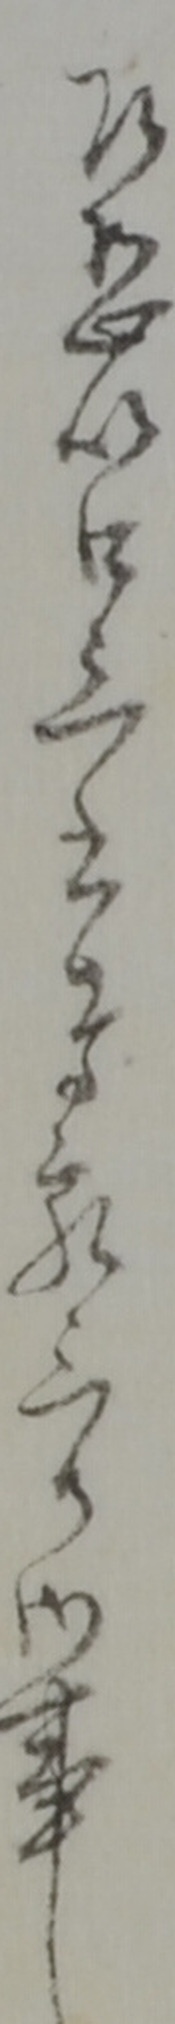乍恐以口上書奉願上候御事
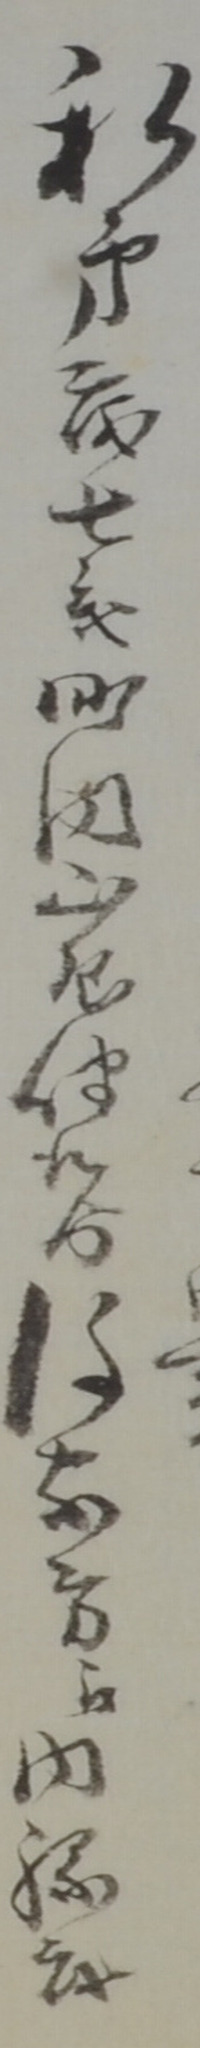私弟茂七義町内山屋伴左衛門後家方え内縁も
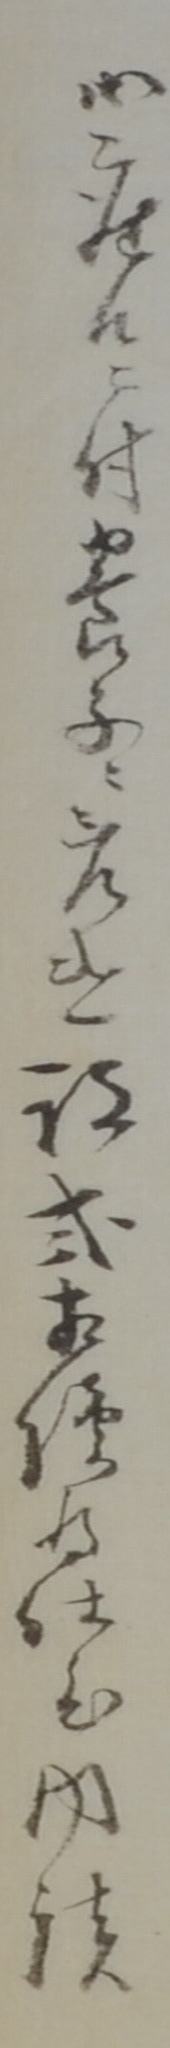御座候ニ付養子ニ差遣跡式相談為仕度内談
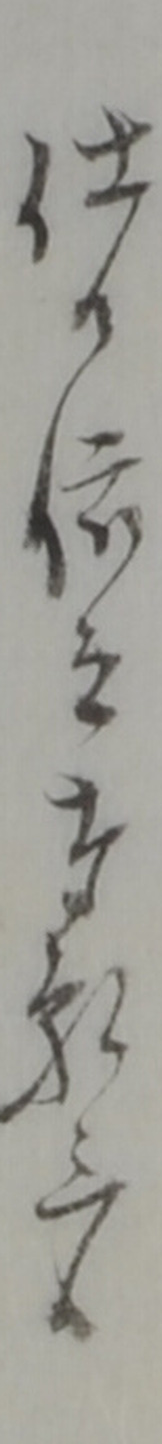仕候依之奉願上候
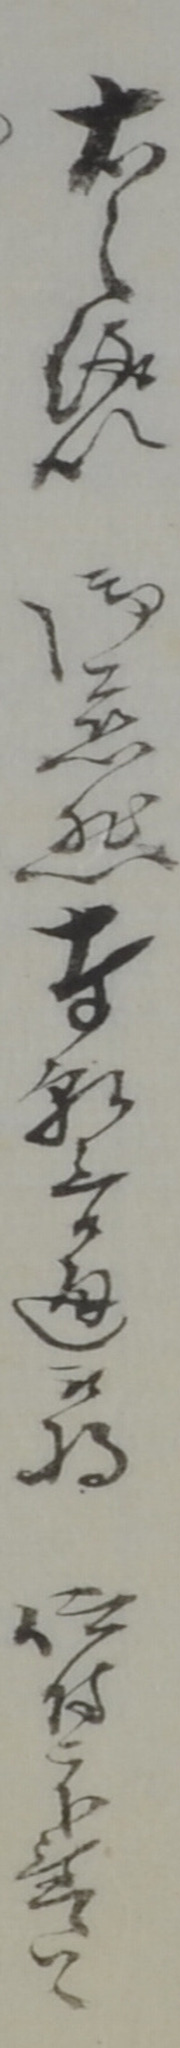右之趣以御慈悲奉願上候通被為仰付被下置候ハヽ
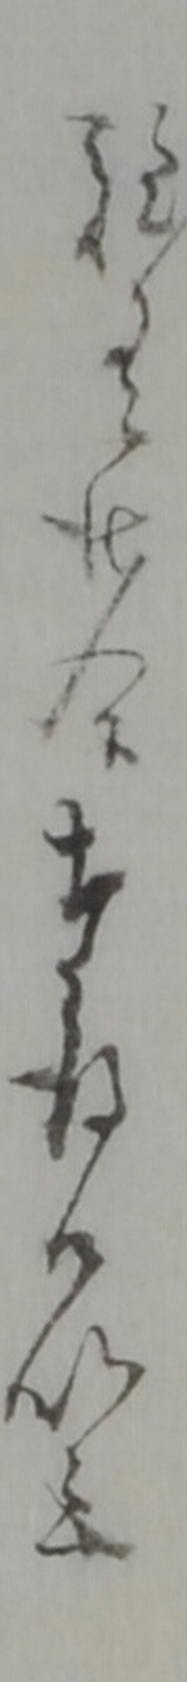難有仕合奉存候以上
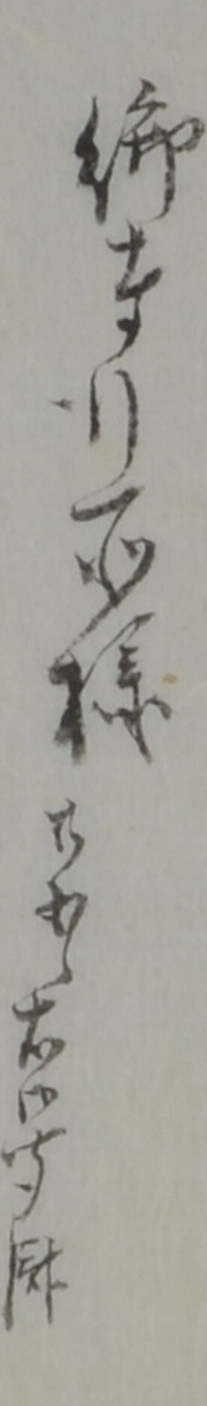御奉行所様廿五日右御聞済
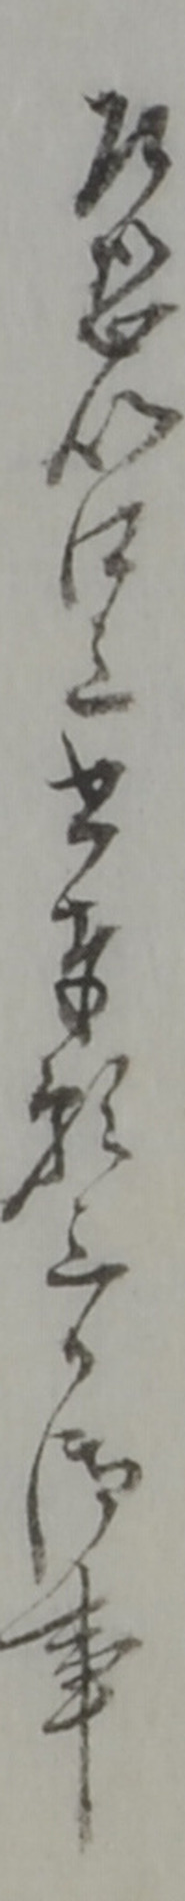乍恐以口上書奉願上候御事
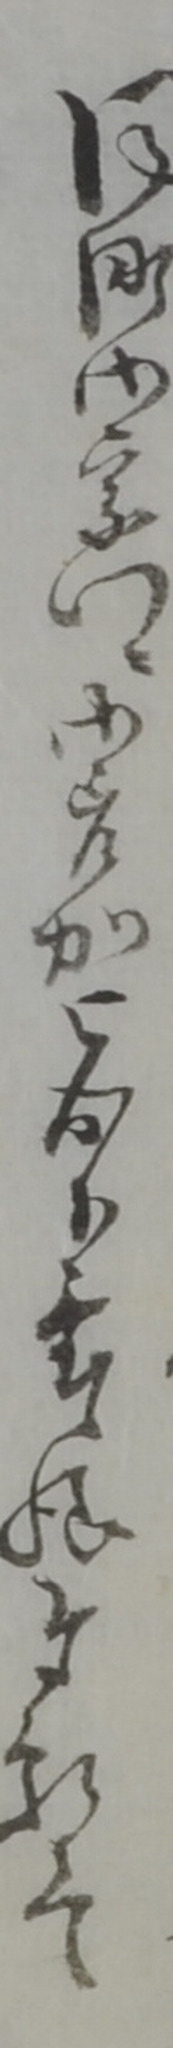同町御宗門ニ御差加被成下置候様奉願上候
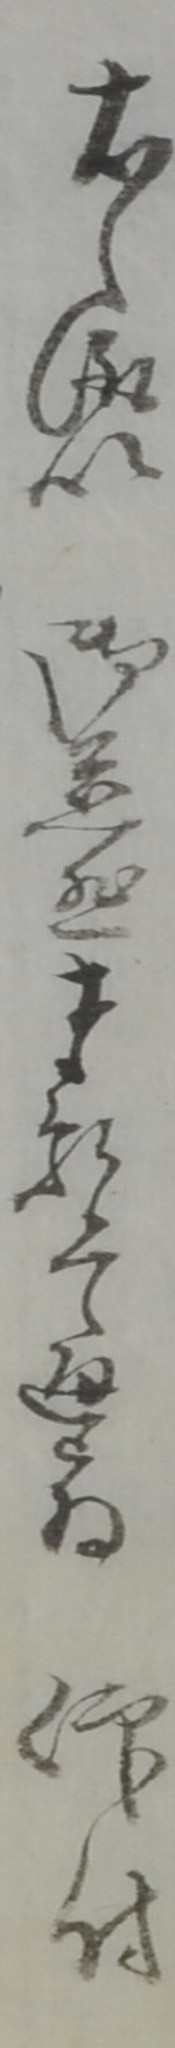右之趣以御慈悲奉願上候通被為仰付
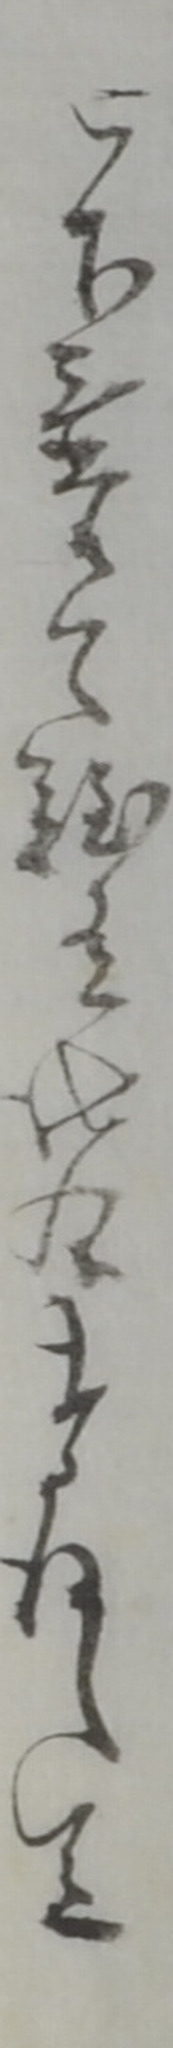被下置候ハヽ難有仕合奉存候以上

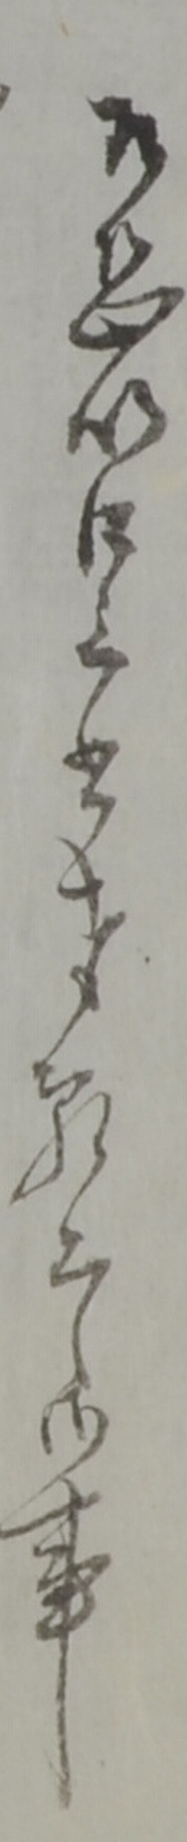乍恐以口上書奉願上候御事
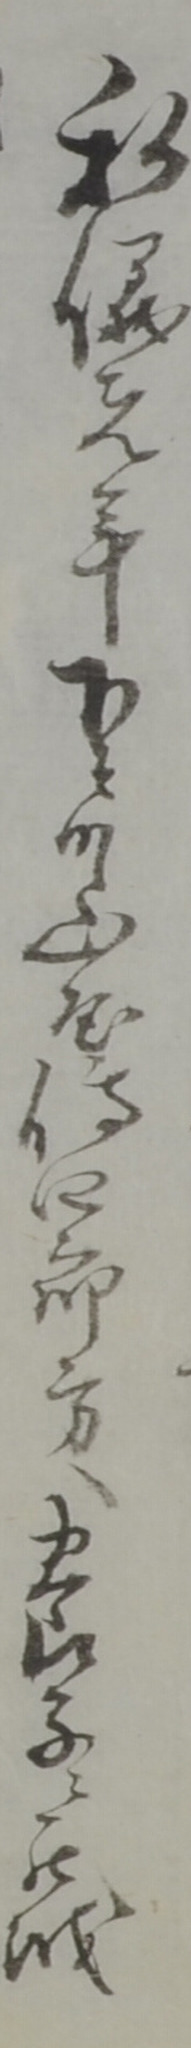私儀先年下モ町山屋伝四郎方へ養子ニ罷越
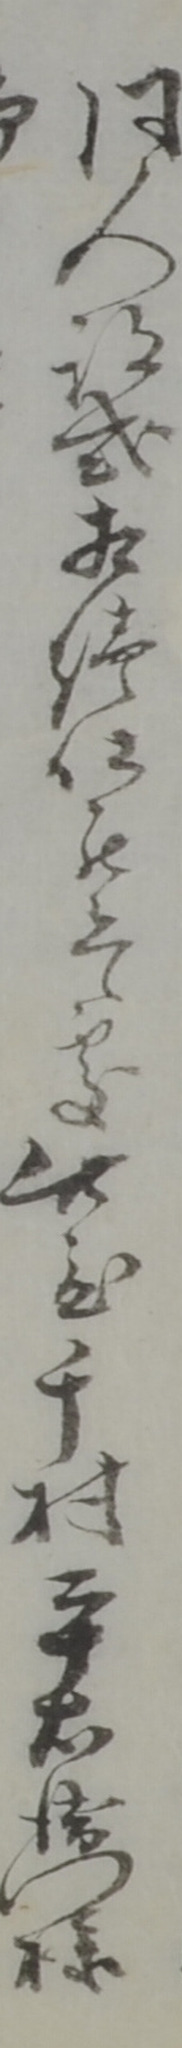同人跡式相続仕罷在候処此度千村平右衛門様
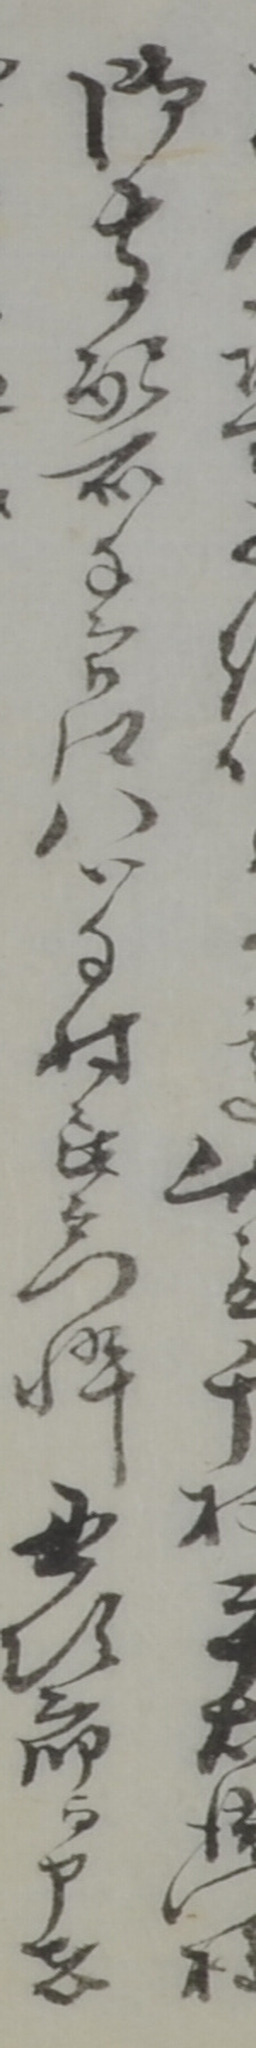御支配所手良郷八ツ手村民右衛門悴丑次郎と申者
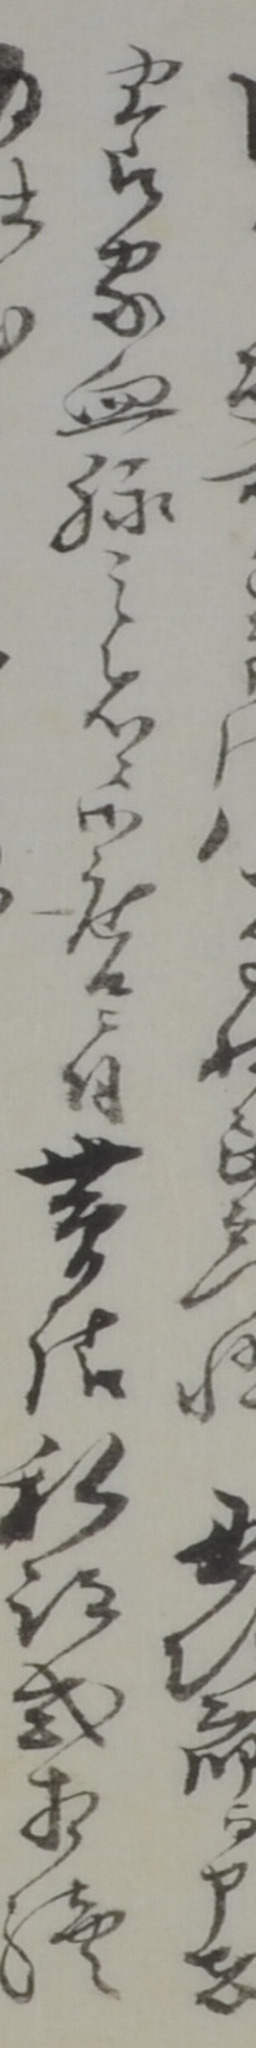養家血縁之者ニ御座候ニ付貰請私跡式相続
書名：諸願書控帳
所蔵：伊那市立高遠町図書館・合同会社AMANE
